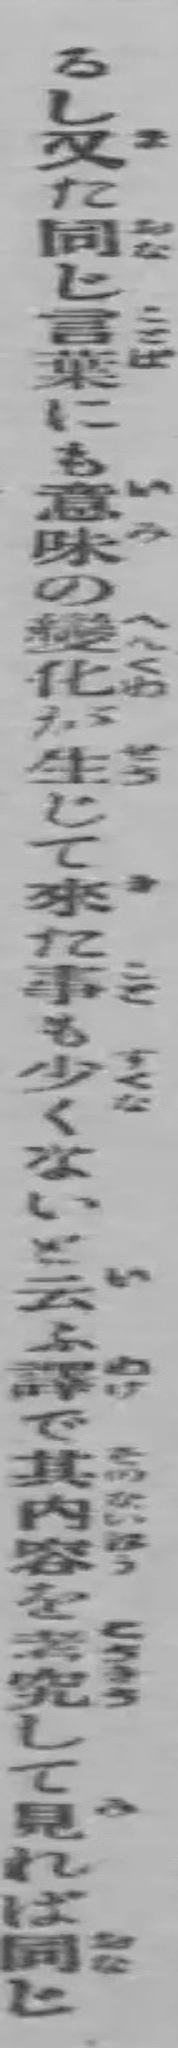るし又た同じ言葉にも意味の変化が生じて来た事も少くないと云ふ訳で其内容を考究して見れば同じ
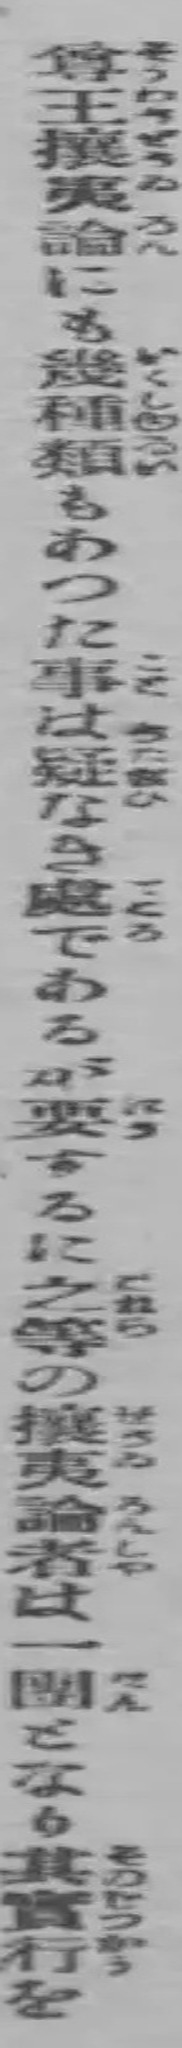尊王攘夷論にも幾種類もあつた事は疑なき処であるが要するに之等の攘夷論者は一団となり其実行を
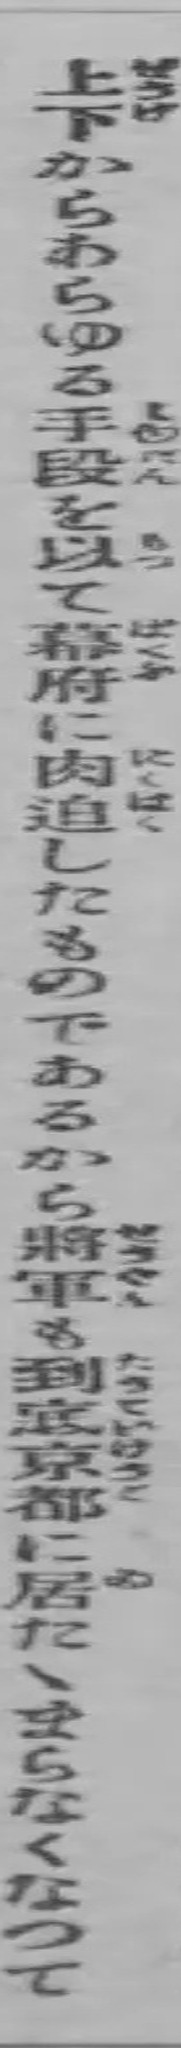上下からあらゆる手段を以て幕府に肉迫したものであるから将軍も到底京都に居たゝまらなくなつて
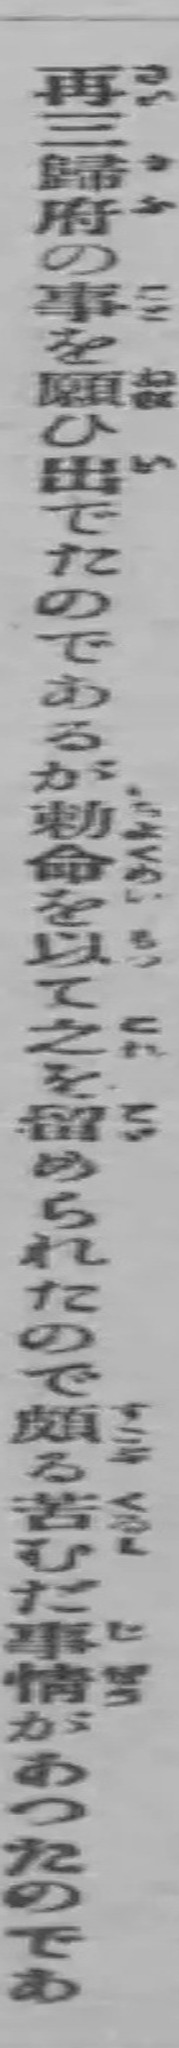再三帰府の事を願ひ出でたのであるが勅命を以て之を留められたので頗る苦むだ事情があつたのであ
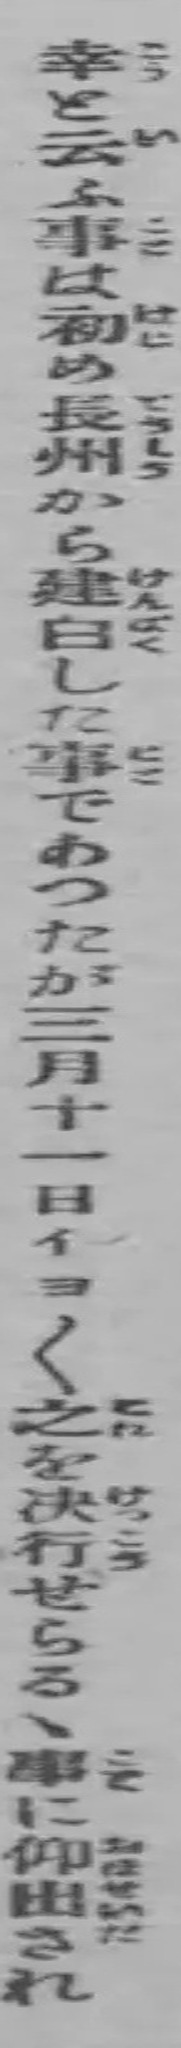幸と云ふ事は初め長州から建白した事であつたが三月十一日イヨ〳〵之を決行せらるゝ事に仰出され
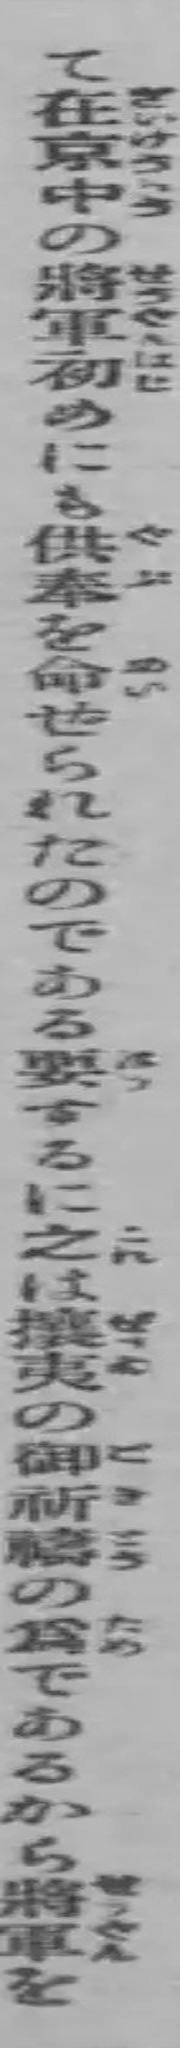て在京中の将軍初めにも供奉を命ぜられたのである要するに之は攘夷の御祈祷の為であるから将軍を
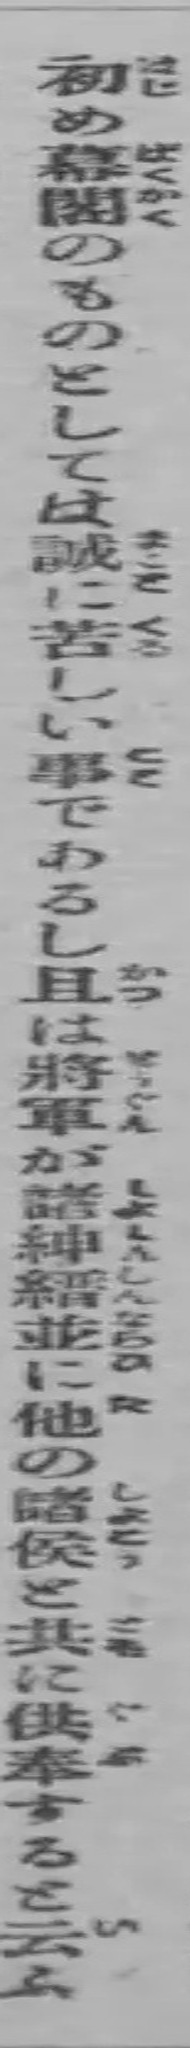初め幕閣のものとしては誠に苦しい事であるし且は将軍が諸縉紳並に他の諸侯と共に供奉すると云ふ
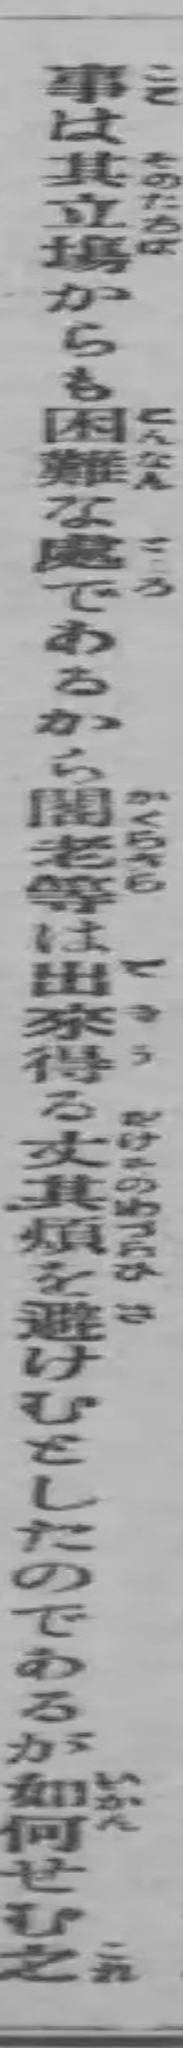事は其立場からも困難な処であるから閣老等は出来得る丈其煩を避けむとしたのであるが如何せむ之
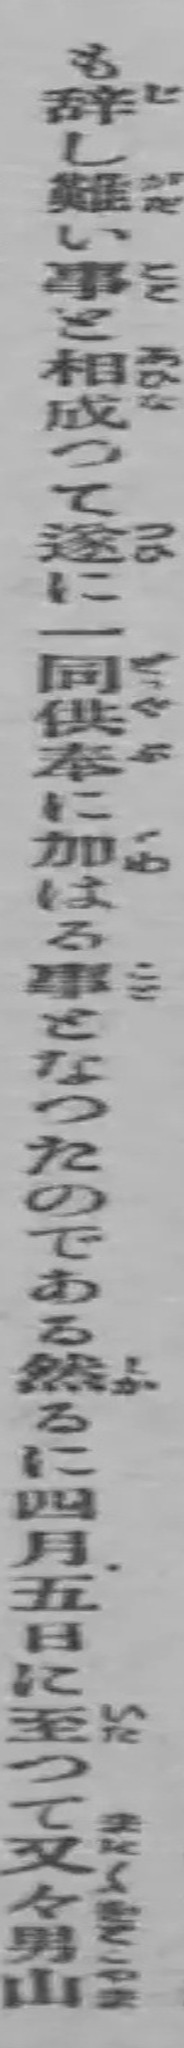も辞し難い事と相成つて遂に一同供奉に加はる事となつたのである然るに四月五日に至つて又々男山
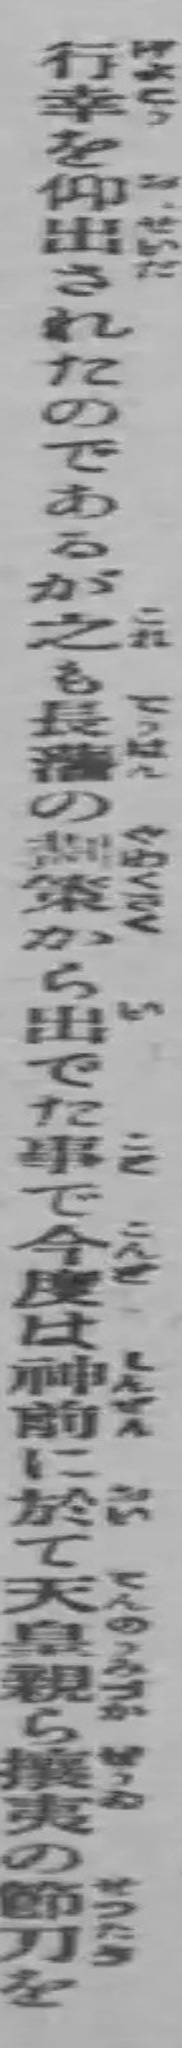行幸を仰出されたのであるが之も長藩の画策から出でた事で今度は神前に於て天皇親ら攘夷の節刀を
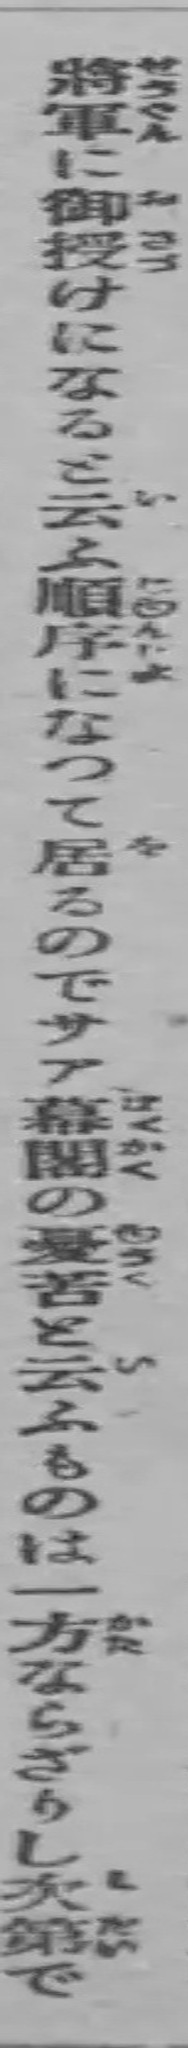将軍に御授けになると云ふ順序になつて居るのでサア幕閣の優苦と云ふものは一方ならざりし次第で
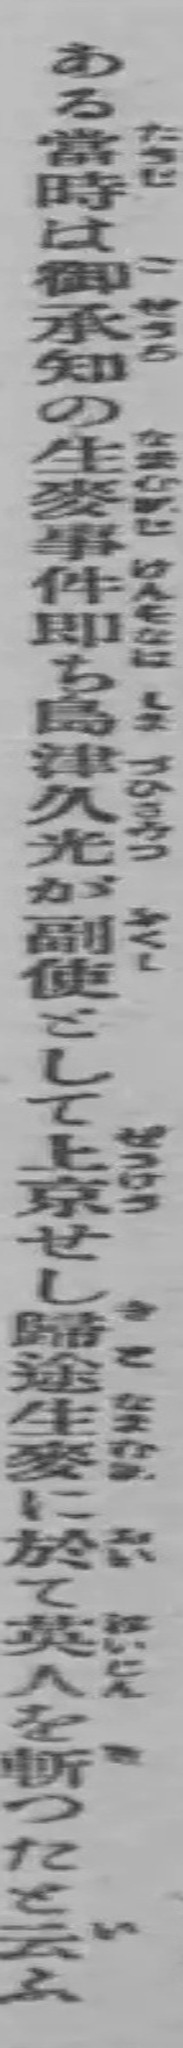ある当時は御承知の生麦事件即ち島津久光が副使として上京せし帰途生麦に於て英人を斬つたと云ふ
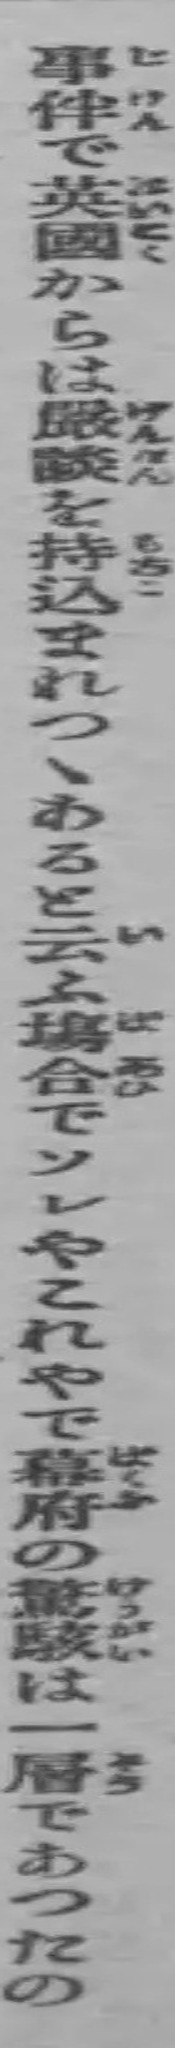事件で英国からは厳談を持込まれつゝあると云ふ場合でソレやこれやで幕府の驚駭は一層であつたの
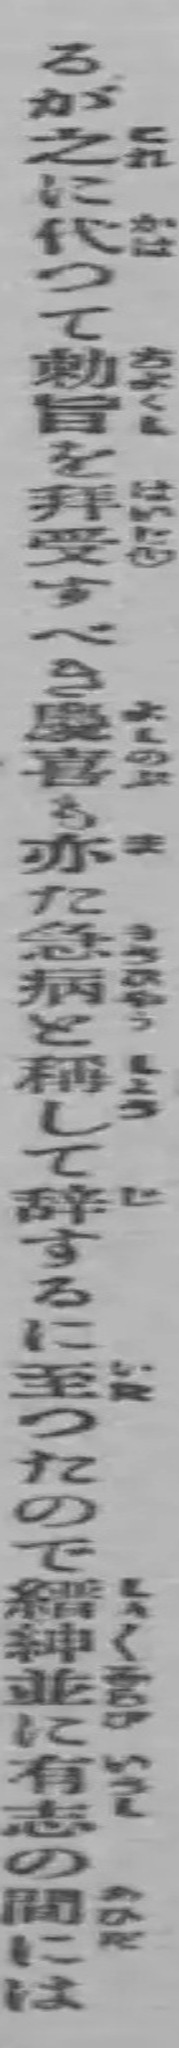るが之に代つて勅旨を拝受すべき慶喜も亦た急病と称して辞するに至つたので縉紳並に有志の間には
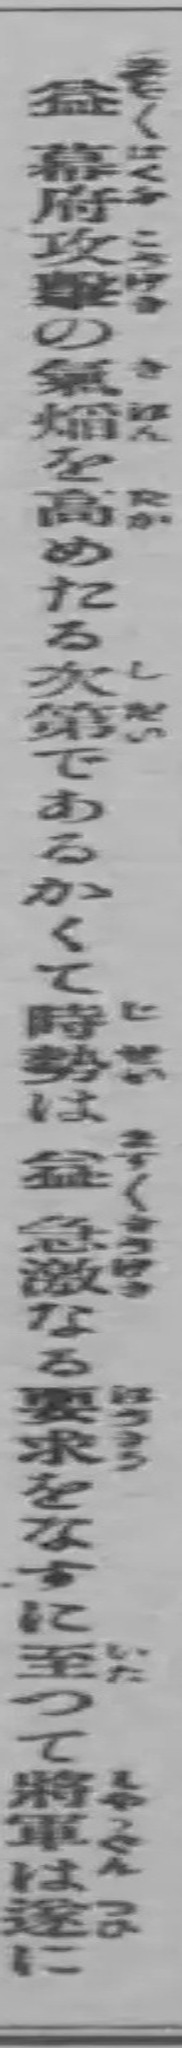益幕府攻撃の気焔を高めたる次第であるかくて時勢は益急激なる要求をなすに至つて将軍は遂に
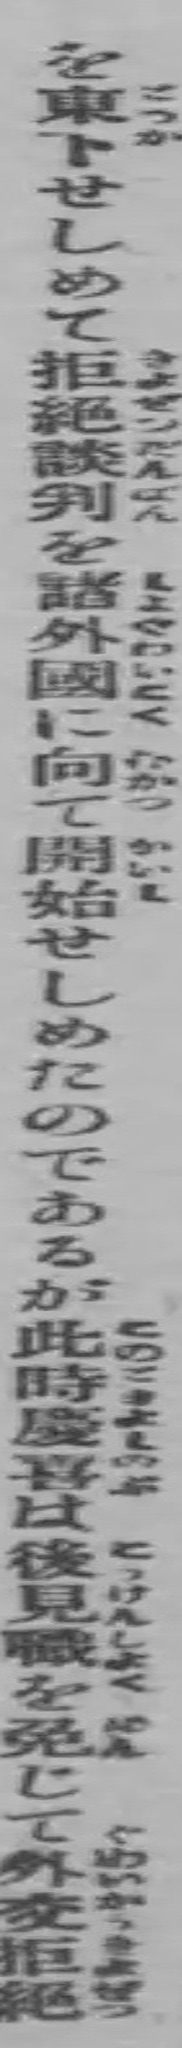慶喜の東下を東下せしめて拒絶談判を諸外国に向て開始せしめたのであるが此時慶喜は後見職を免じて外交拒絶
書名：豊橋市史談
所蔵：国立国会図書館 National Diet Library, JAPAN
